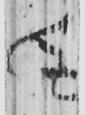氒
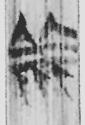羕
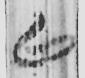㠯（以）
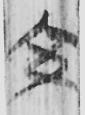交
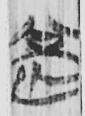罔
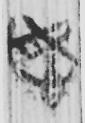悔（謀）
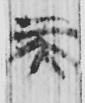天
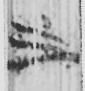之
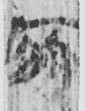所
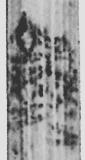{亯羊帚止}
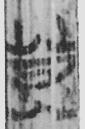莫
